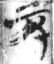亥
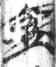寍（寧）
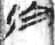於
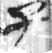子
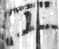工（空）
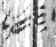於
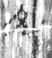丑
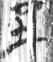坐
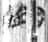於
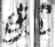寅
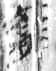盍（蓋）
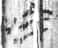於
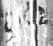卯
